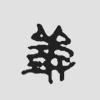襄
